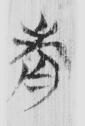歬
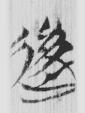後
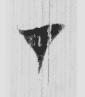丁
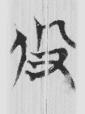伇
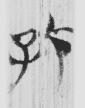孤
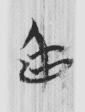身
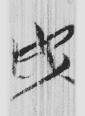𡚦
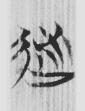述
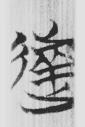{辶止㚔}
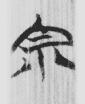宗
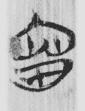{宀苗}
